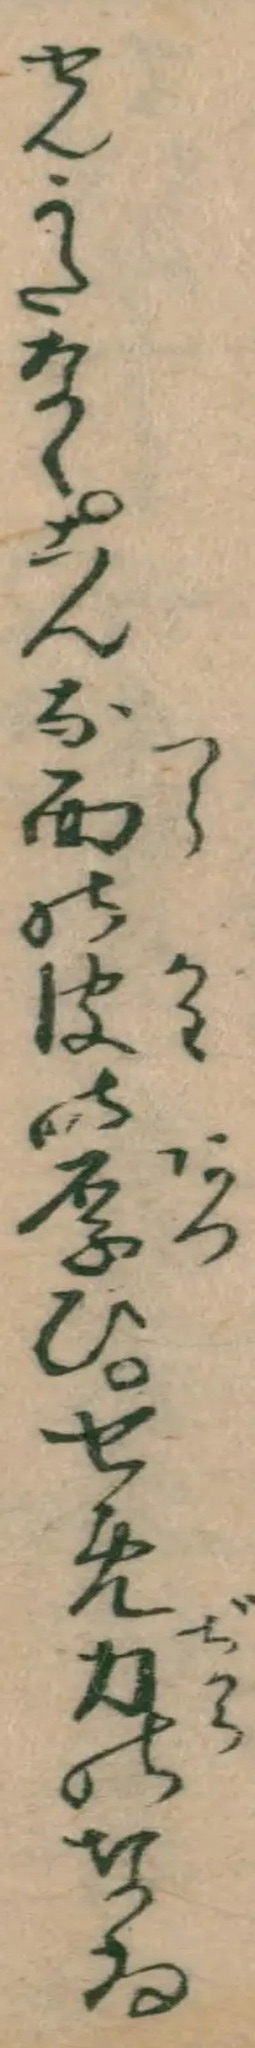せんかたなく。こんな面の皮の厚ひ。せめ力のなゐ
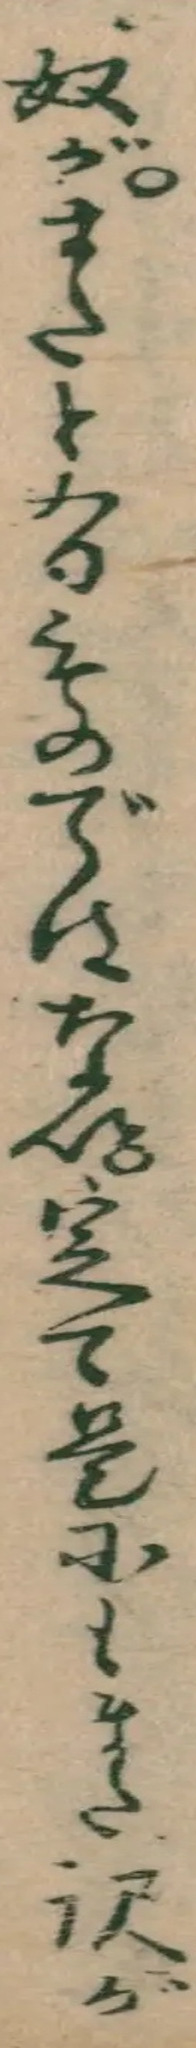奴が。またと有ものではない。定て是にもまた訳が
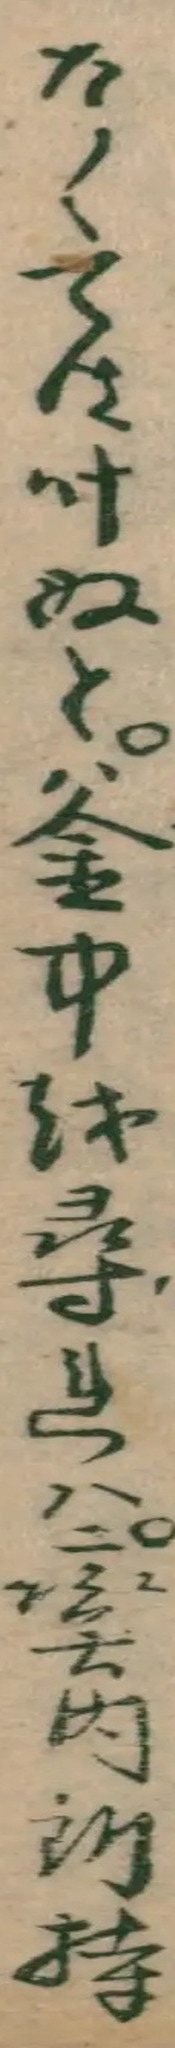なくては叶ぬと。釜中を尋れは。蛮内所持
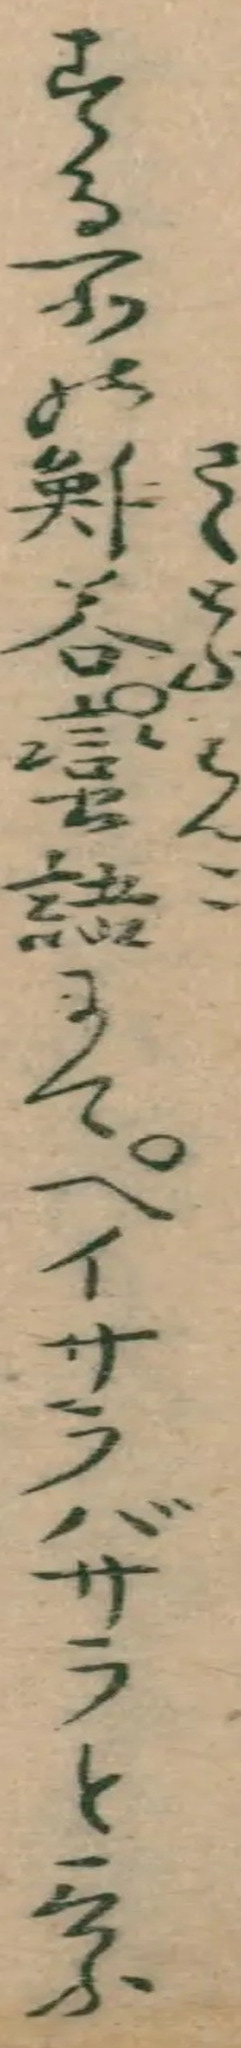する所の鮓答。蛮語にて。ヘイサラバサラと言ふ
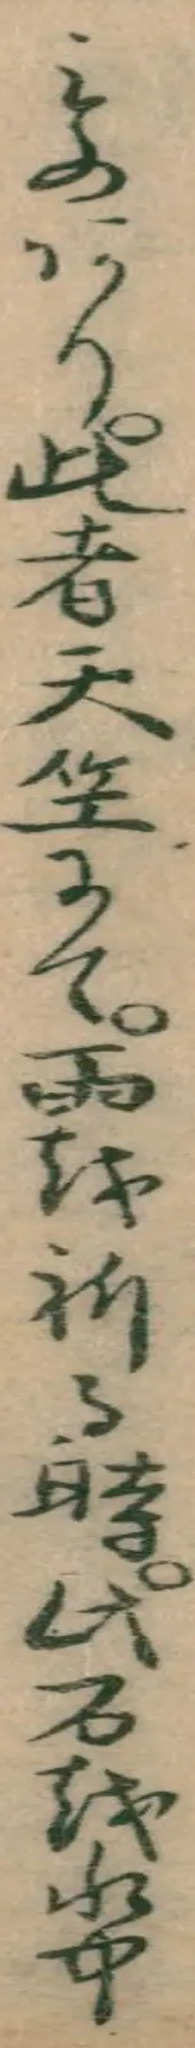ものあり。此者天竺にて。雨を祈る時。此石を水中
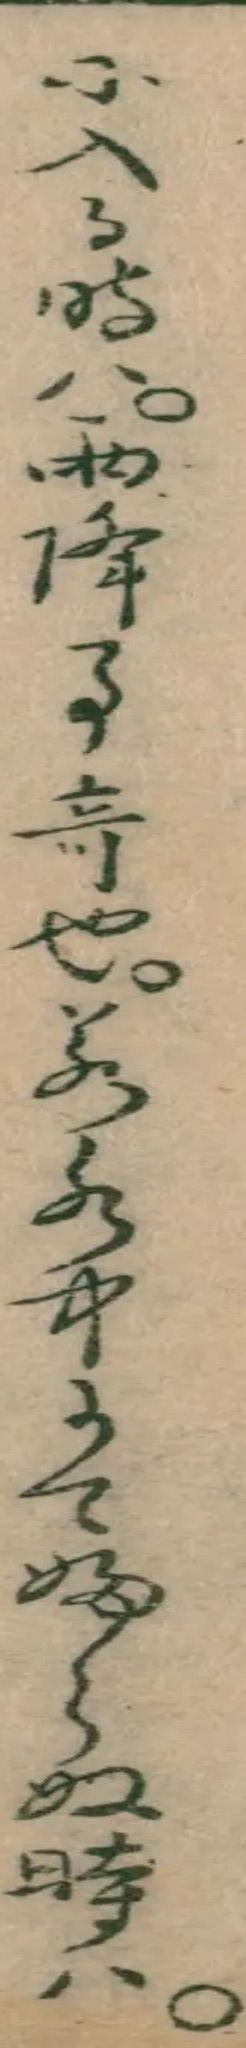に入る時は。雨降事奇也。若水中にてふらぬ時は。
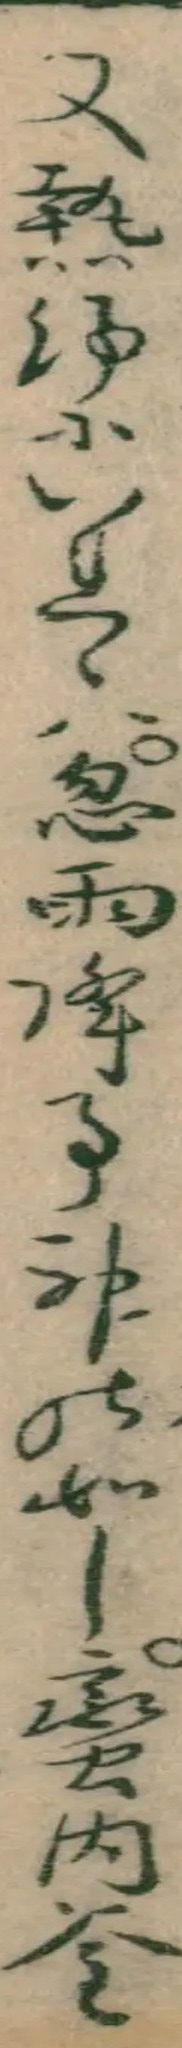又熱湯にいれゝは。忽雨降事神の如し。蛮内釜
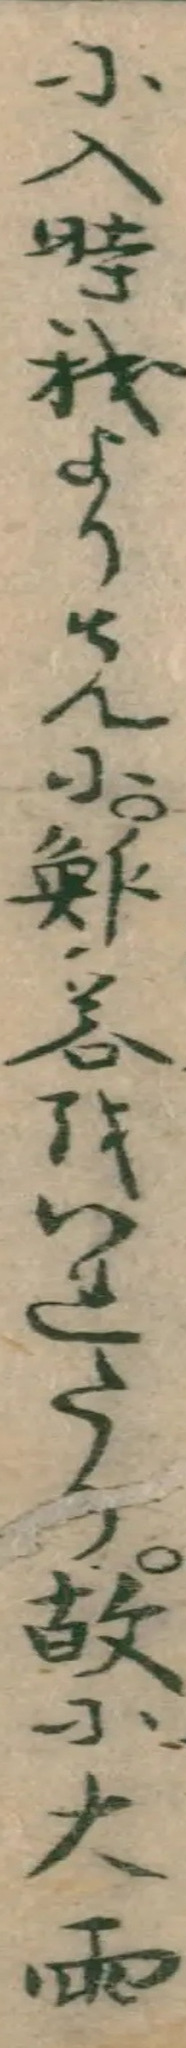に入時我より先に。鮓答をいれたり。故に大雨
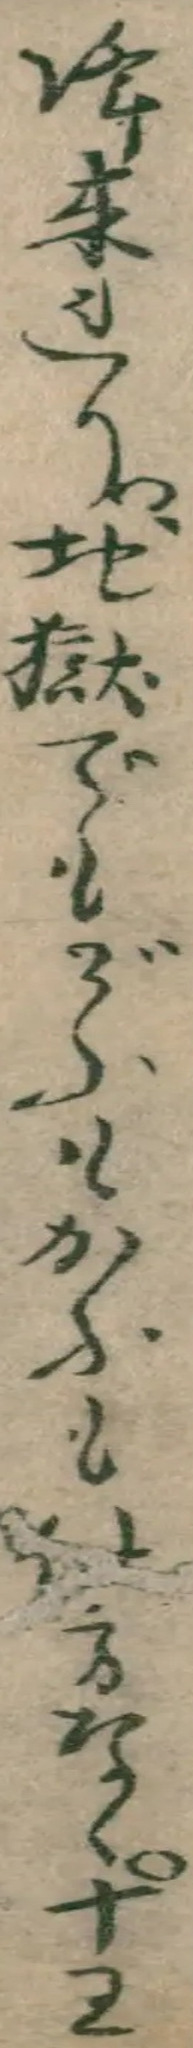降来れり。地獄でもどふもかふも方なく。十王
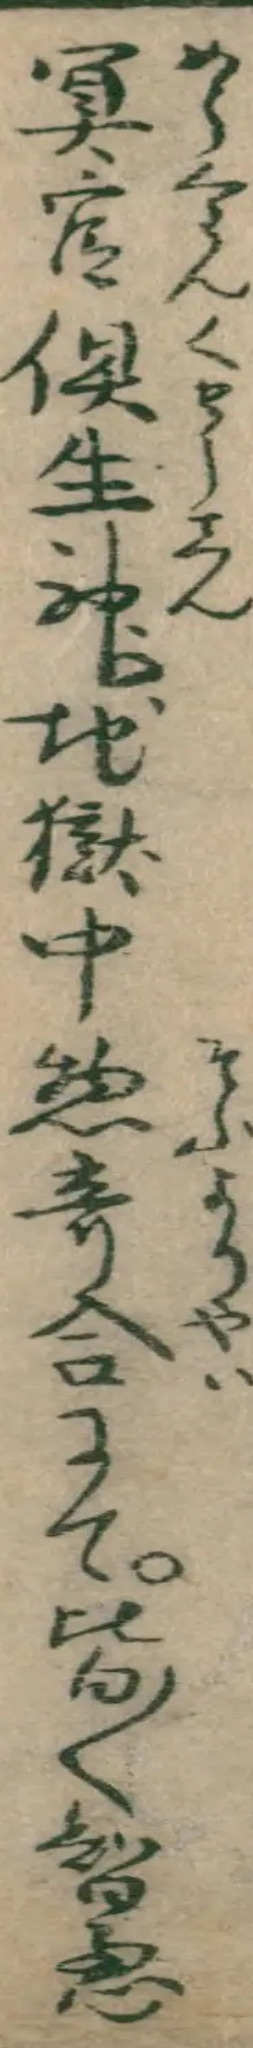冥官俱生神。地獄中総奇合にて。皆〳〵智恵
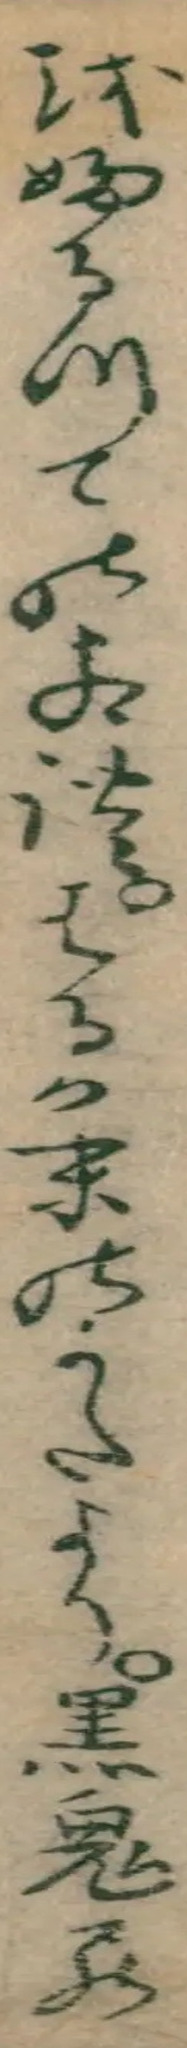をふるつての相談。はるか末のかたより。黒鬼罷

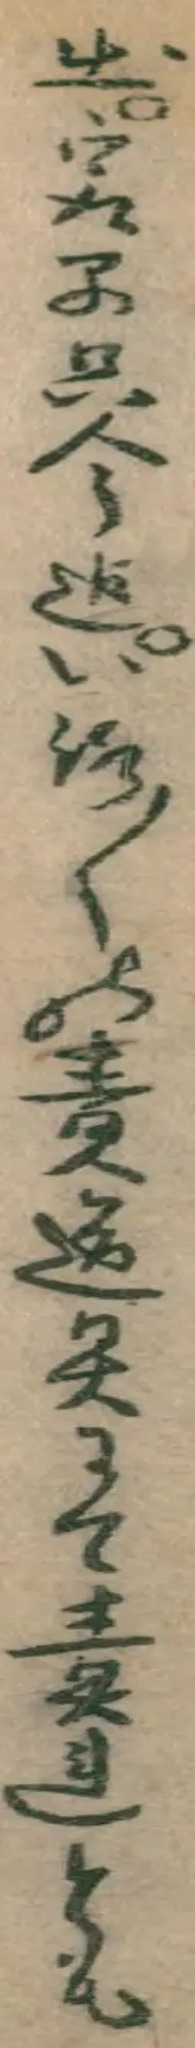出。最早只今迄。いろ〳〵の責道具にて責れとも
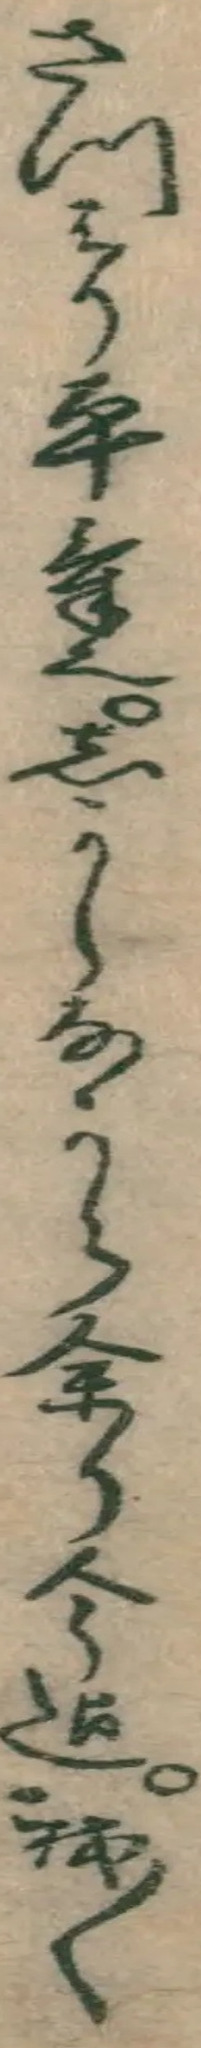さつはり平気也。しかしなから余り今迄。我〳〵
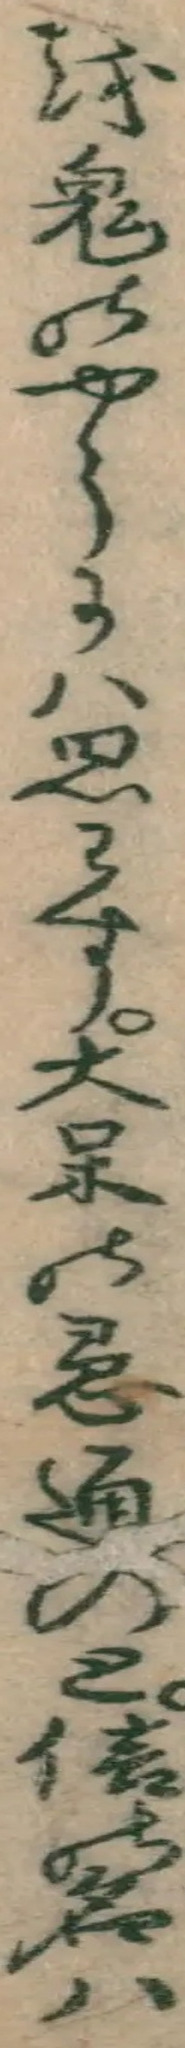を鬼のやうには思わす。大呆の愚通のと。信の名は
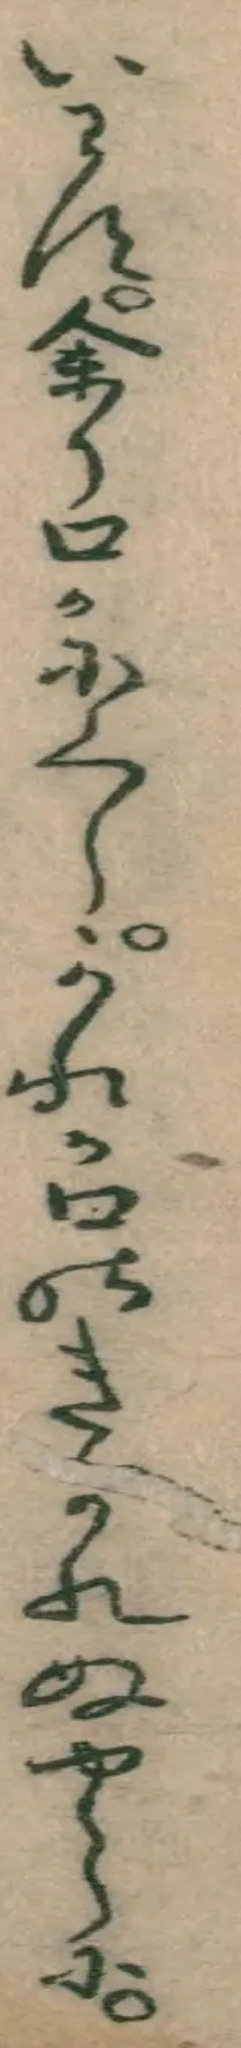いわす。余り口かにくし。かれか口のきかれぬやうに。
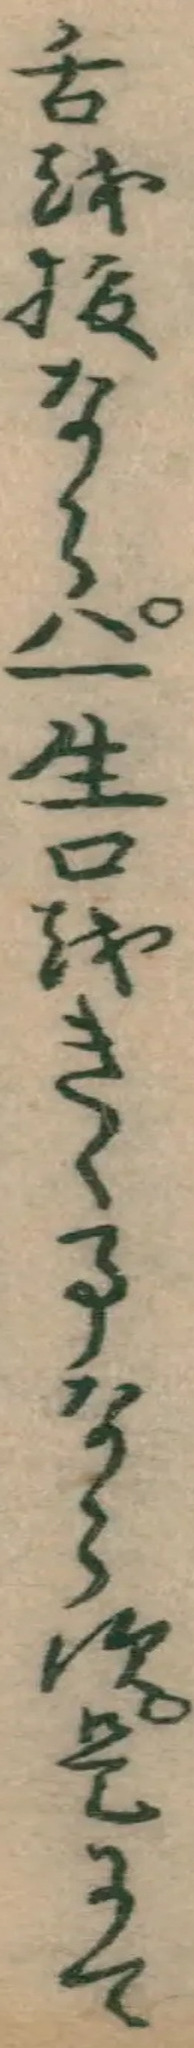舌を抜ならは。一生口をきく事ならす。是にて
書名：翻草盲目
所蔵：国立国会図書館 National Diet Library, JAPAN
